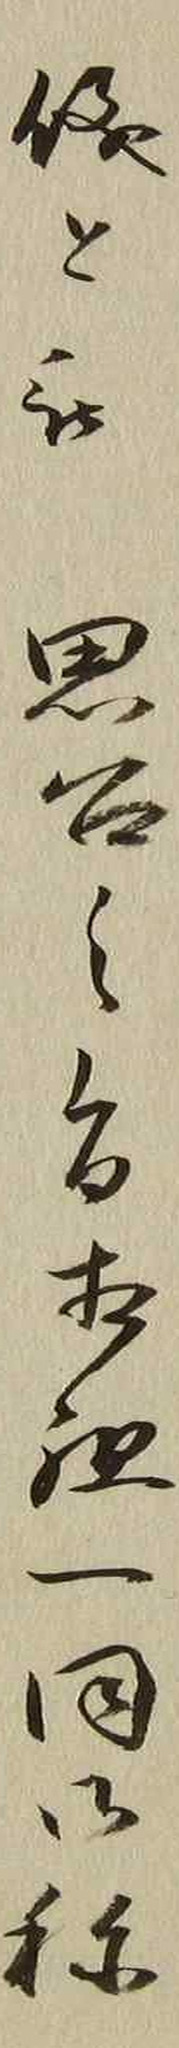儀と被思召之旨相組一同御称
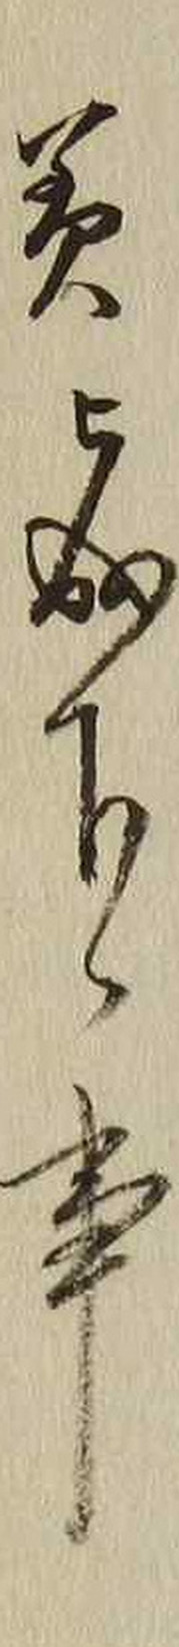美被成下候事
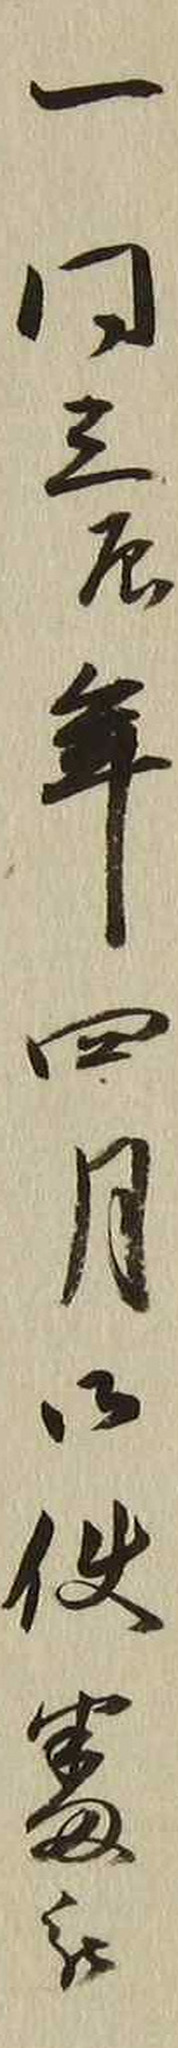一同三辰年四月御使番被
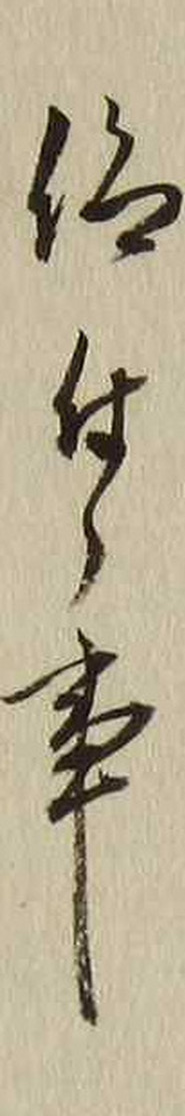仰付候事
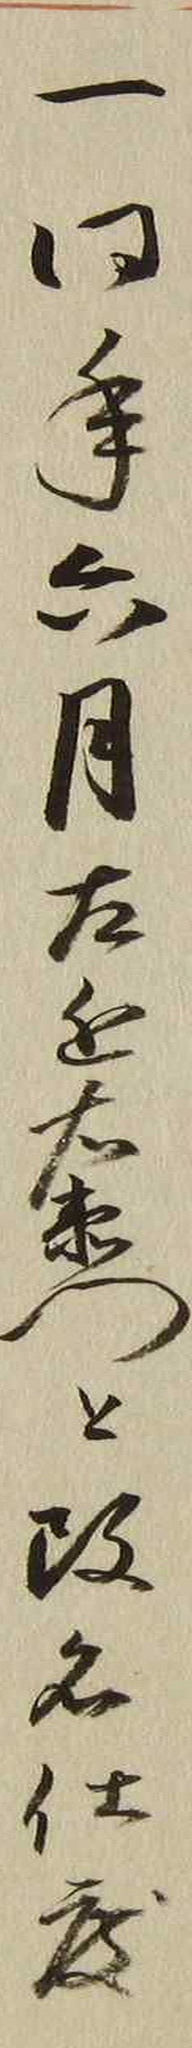一同年六月左近右衛門と改名仕度
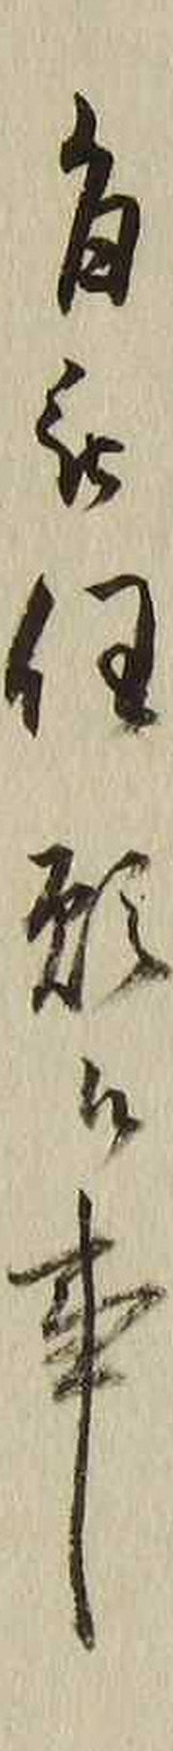旨被任願候事
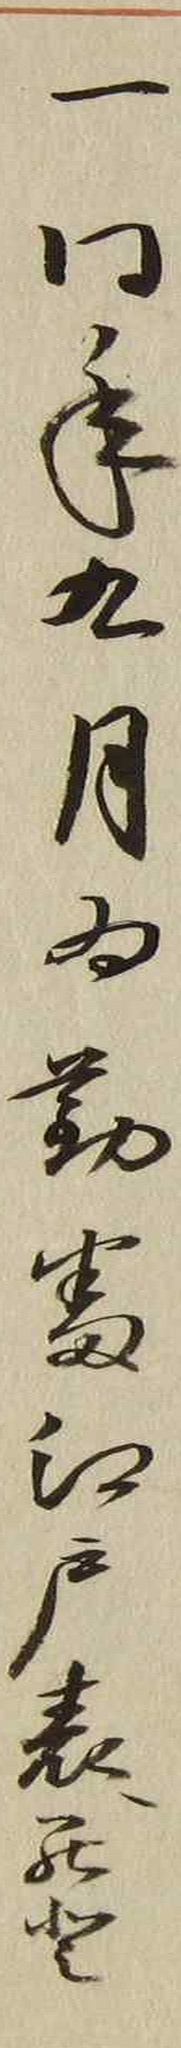一同年九月為勤番江戸表へ罷登
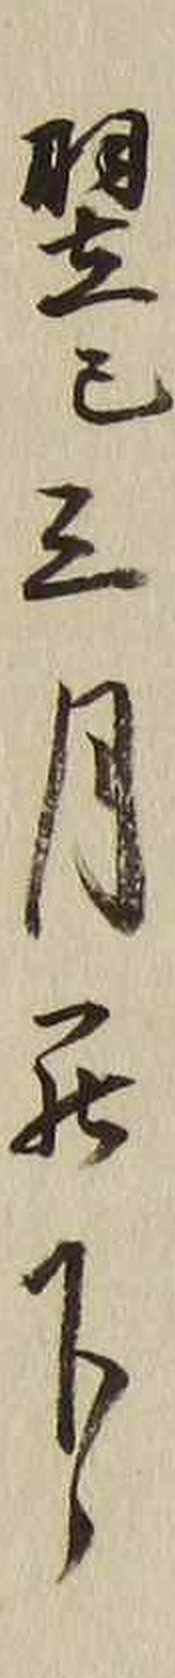翌巳三月罷下候
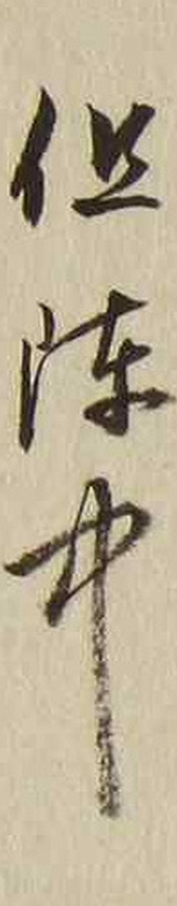但陣中

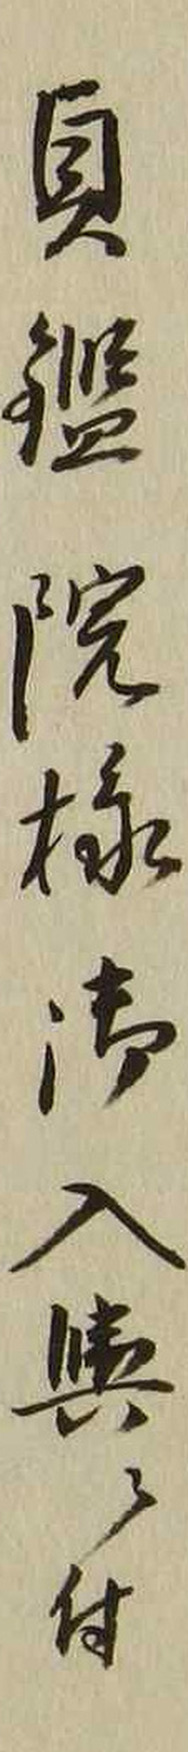貞鑑院様御入輿ニ付
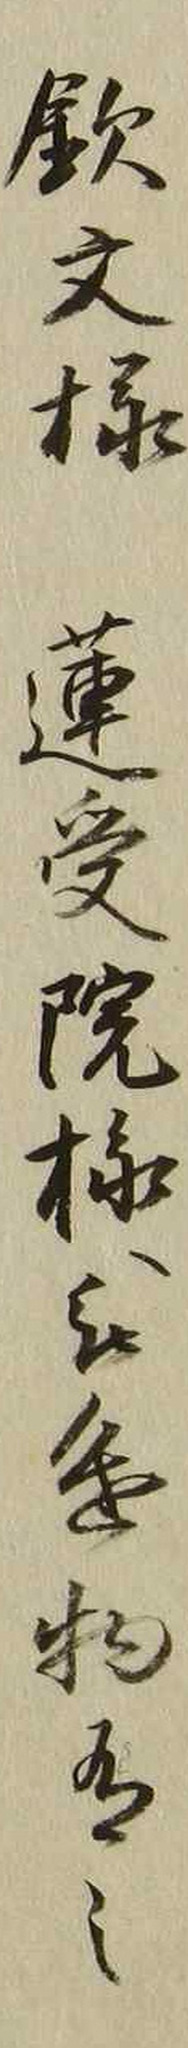欽文様蓮受院様へ被進物有之
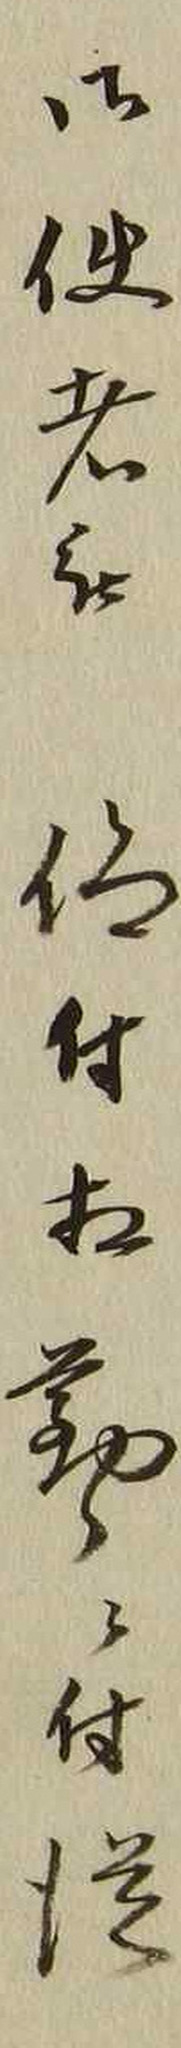御使者被仰付相勤ニ付従
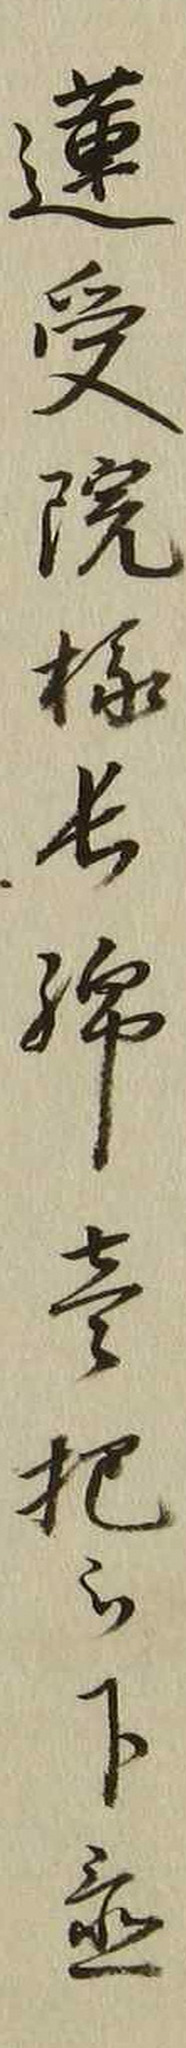蓮受院様長綿壱把被下置
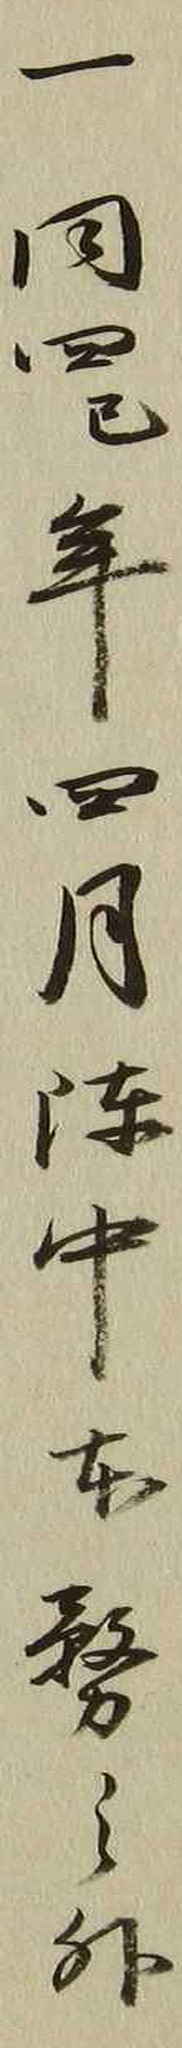一同四巳年四月陣中本務之外
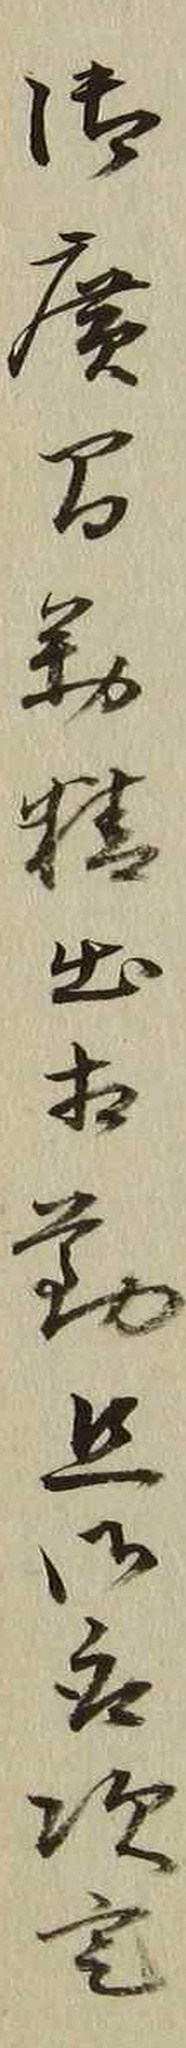御広間勤精出相勤且御取次定
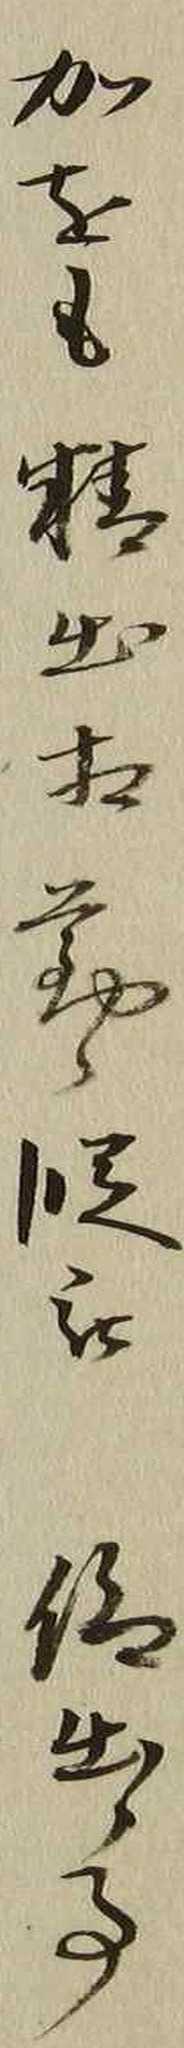加をも精出相勤段被仰出候事
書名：諸士系譜　巻之69　を之部3
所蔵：会津若松市立会津図書館
